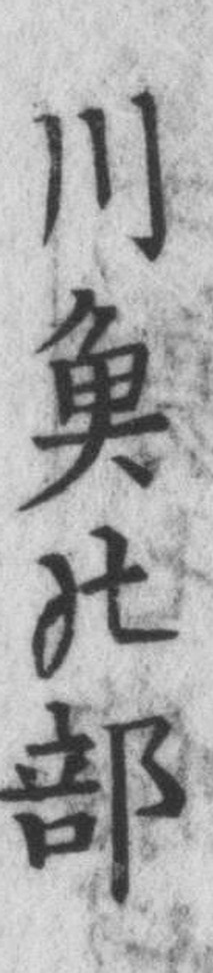川魚の部

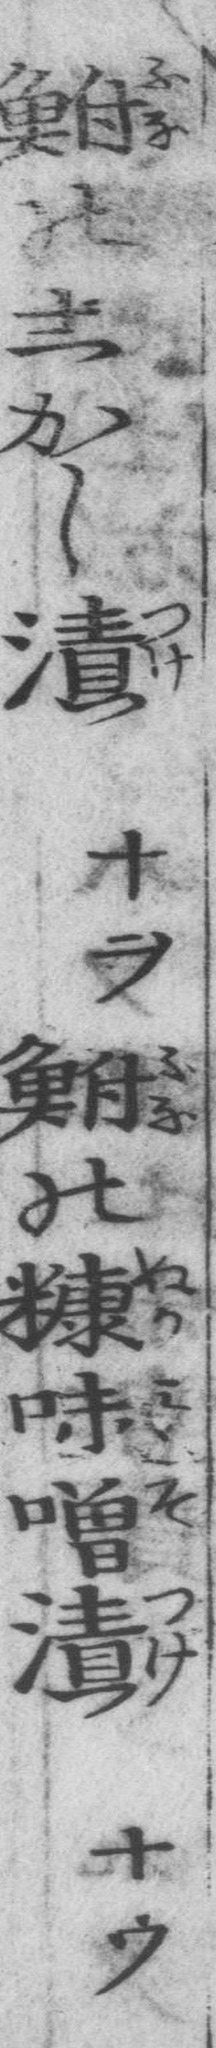鮒のこかし漬十ヲ鮒の糠味噌漬十ウ
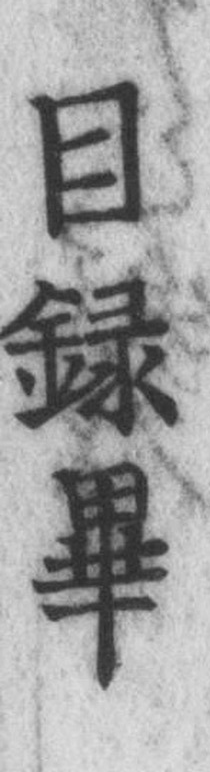目録畢
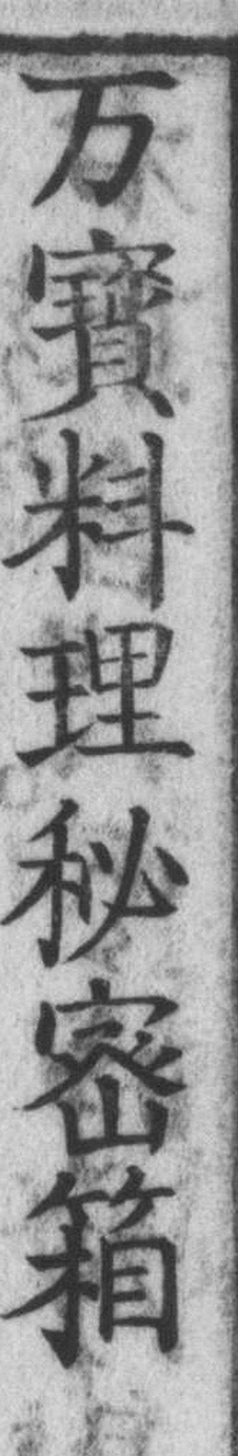万宝料理秘密箱
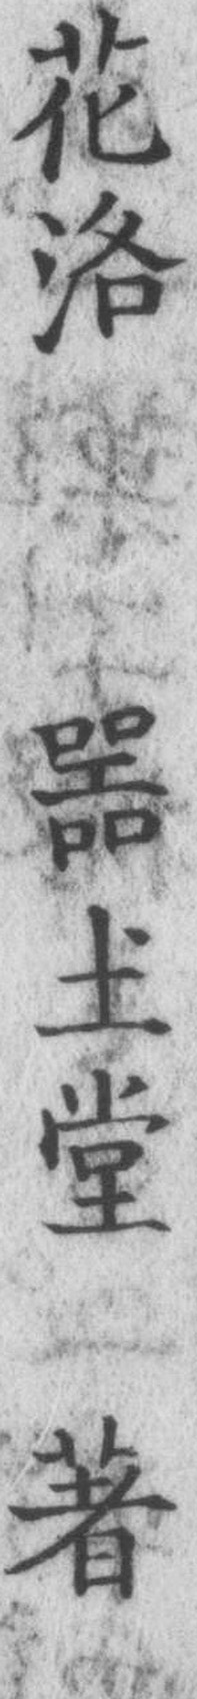花洛器土堂著
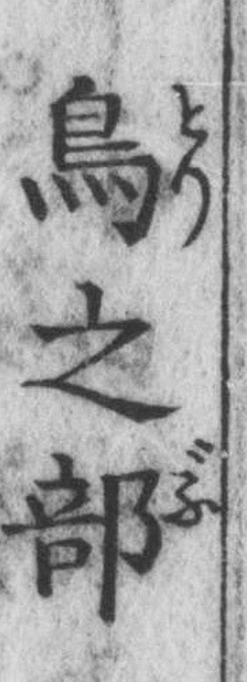鳥之部
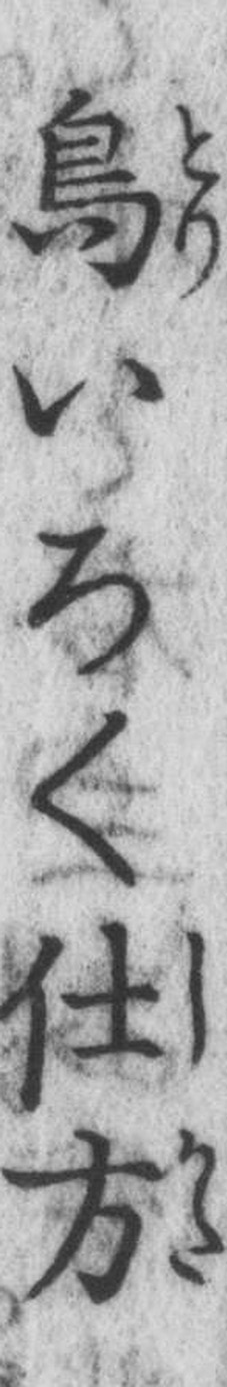鳥いろ〳〵仕方
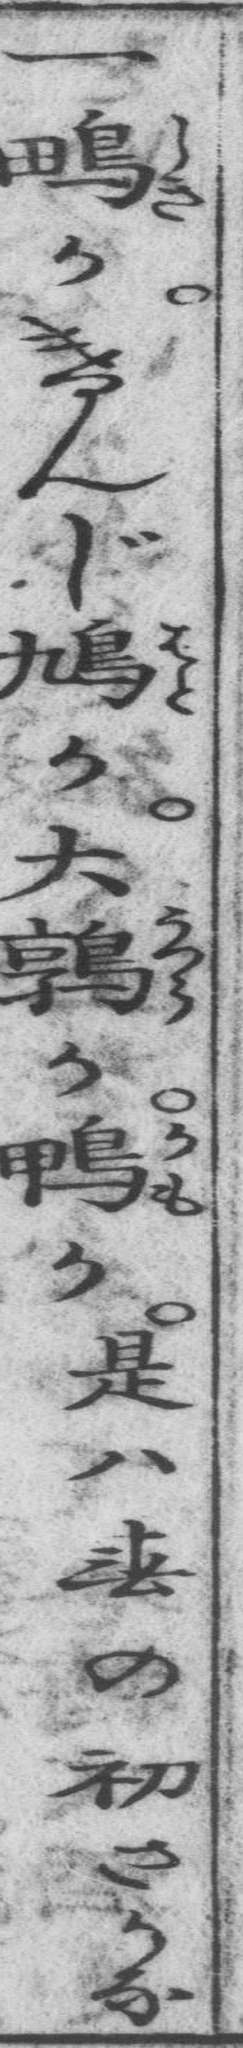一鴫か。けんじ鳩か。大鶉か。鴨か。是は春の初さかな
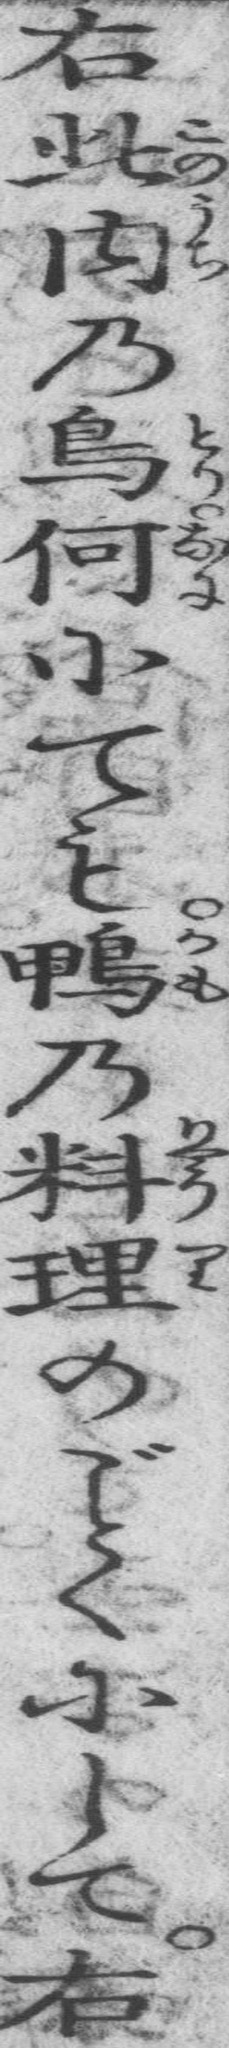右此内の鳥。何にても。鴨の料理のごとくにして。右
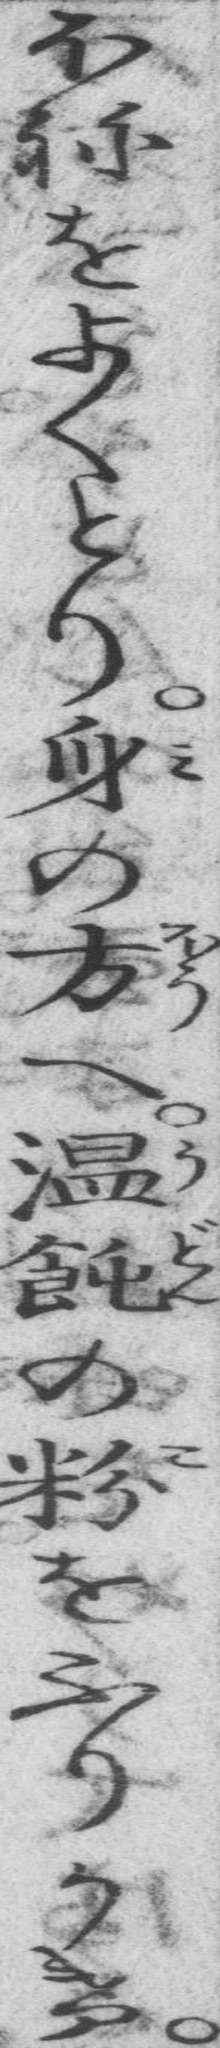ほねをよくとり。身の方へ。饂飩の粉をふりかけ。
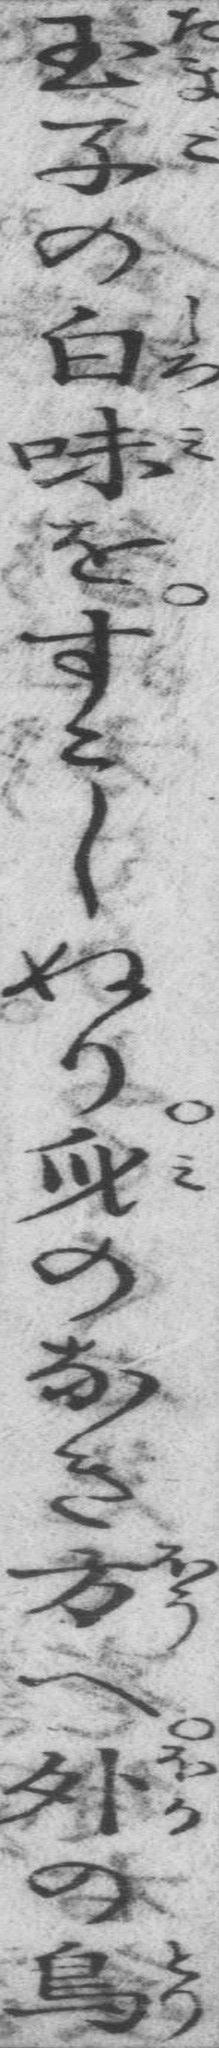玉子の白味を。すこしぬり。身のなき方へ。外の鳥
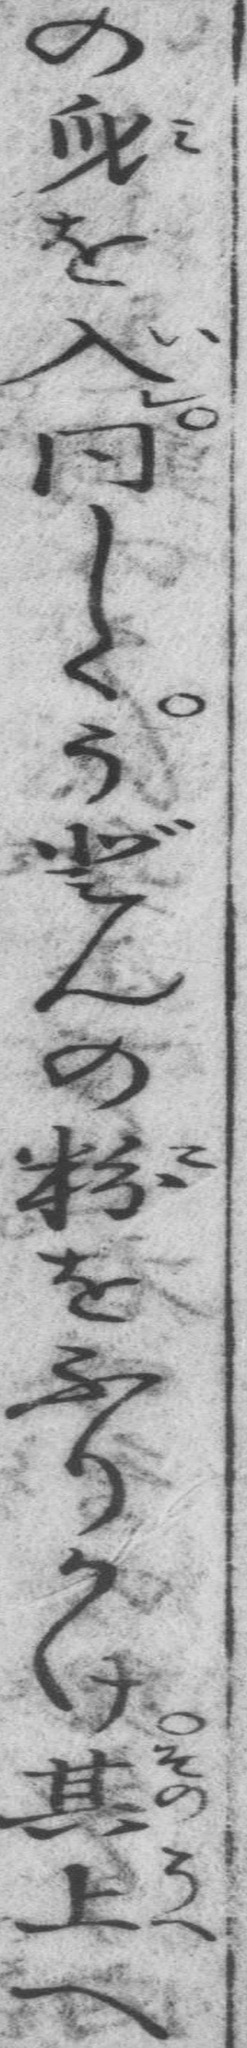身を入れ。同しく。うどんの粉をふりかけ。其上へ

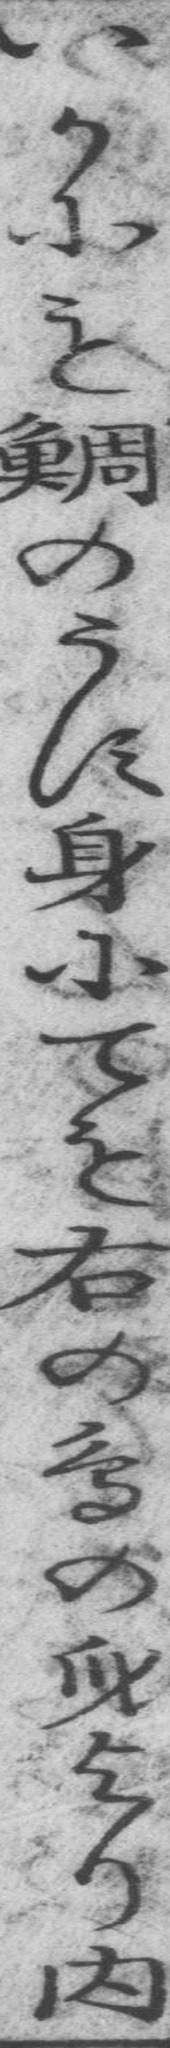いかにも。鯛のうす身にても。右の鳥の身より。内
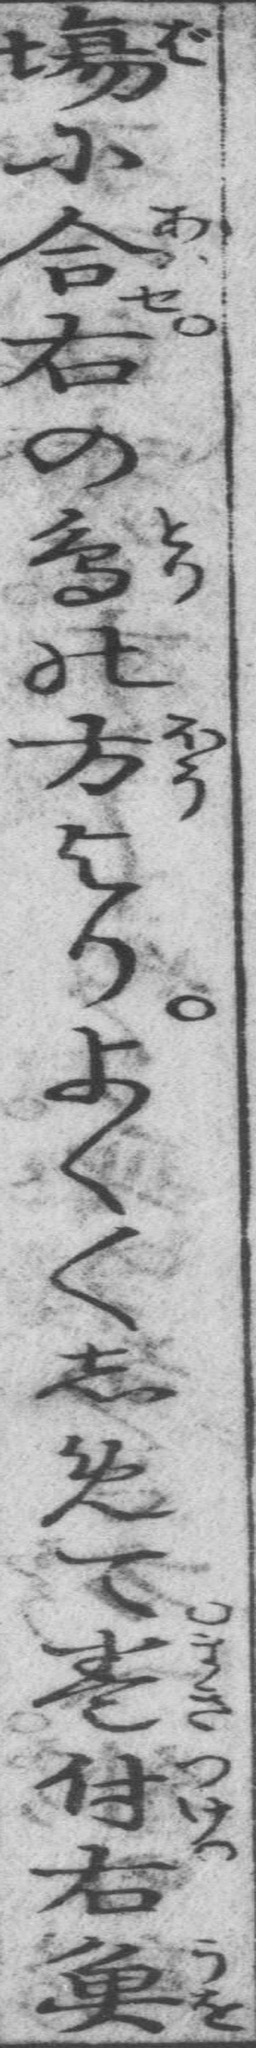場に合せ。右の鳥の方より。よく〳〵しめて。巻付。右魚
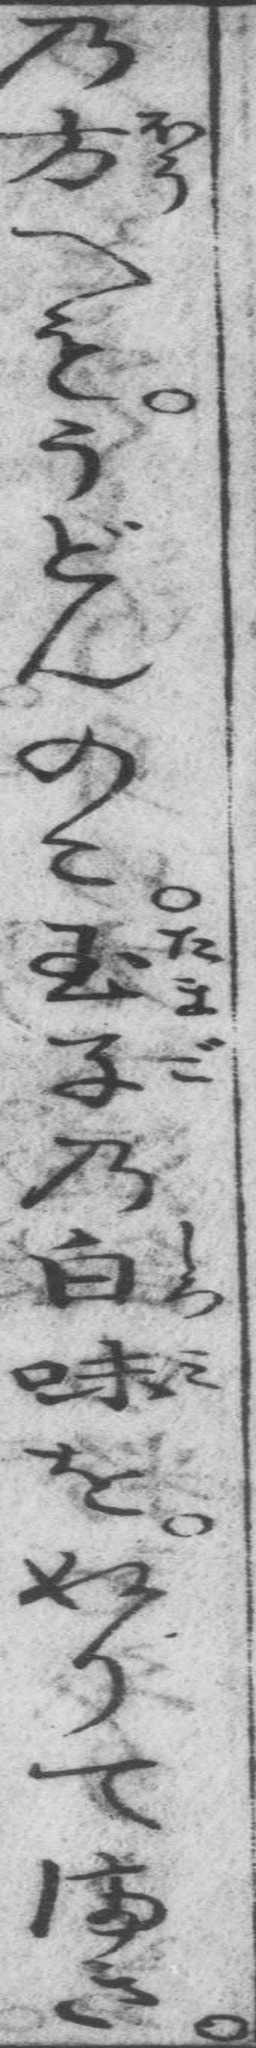の方へも。うどんのこ。玉子の白味を。ぬりてまき。
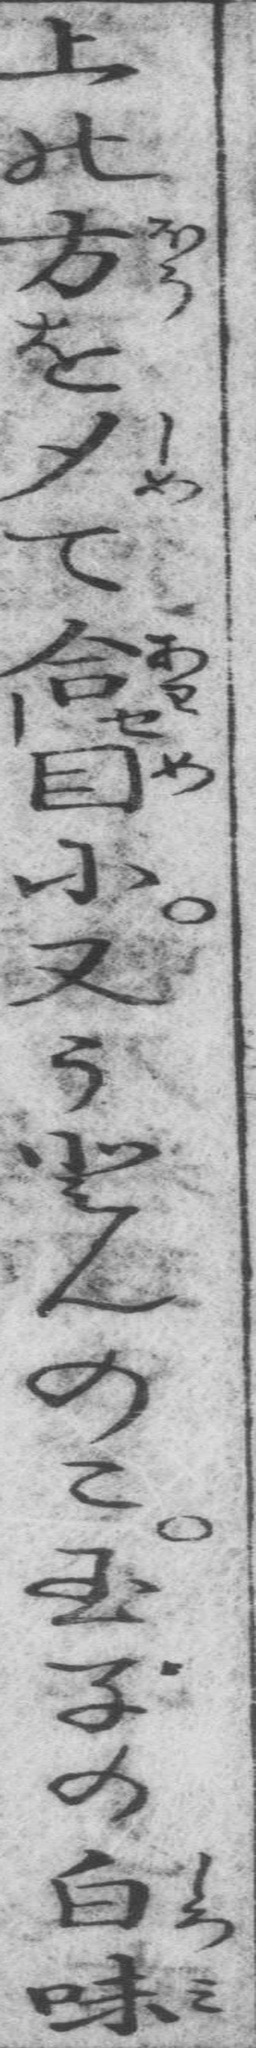上の方を〆て合せ目に。又うとんのこ。玉子の白味
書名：萬寳料理秘密箱
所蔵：大阪府立大学学術情報センター 国文学研究資料館
